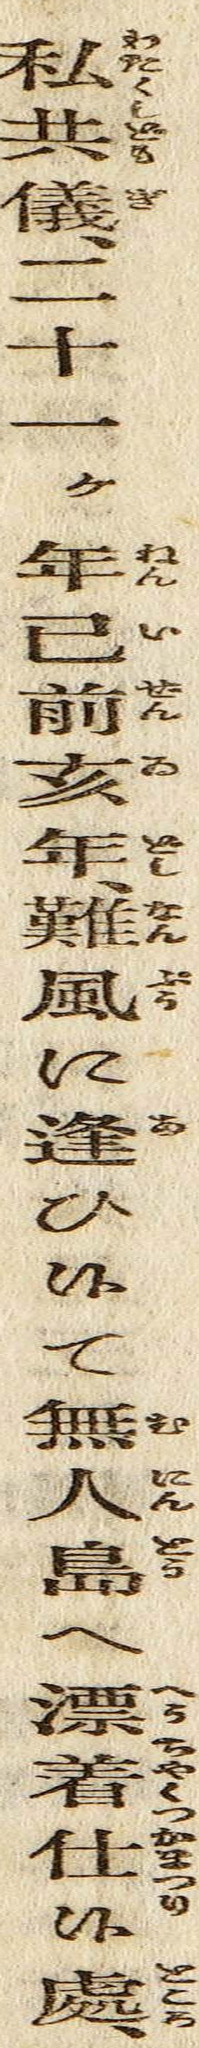私共儀、二十一ヶ年已然亥年、難風に逢ひ候て無人島へ漂着仕候処、
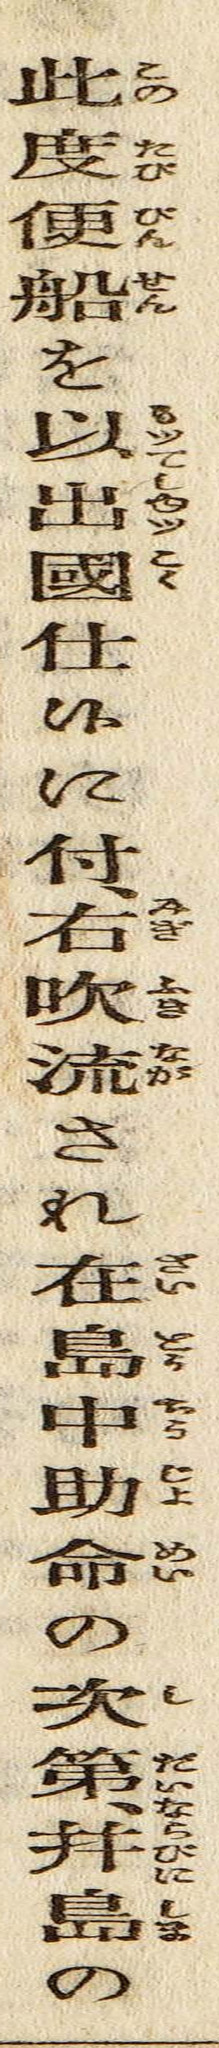此度便船を以出国仕候に付、右吹流され在島中助命の次第、并島の
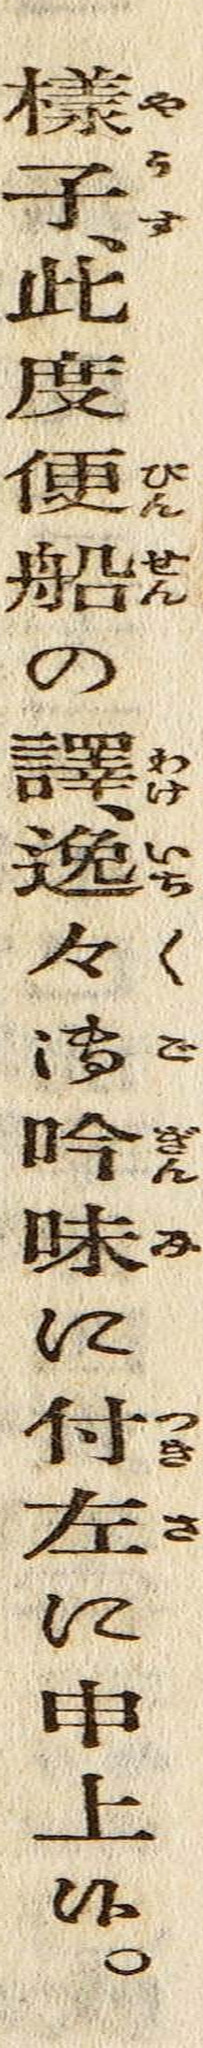様子、此度便船の訳、逸々御吟味に付左に申上候。
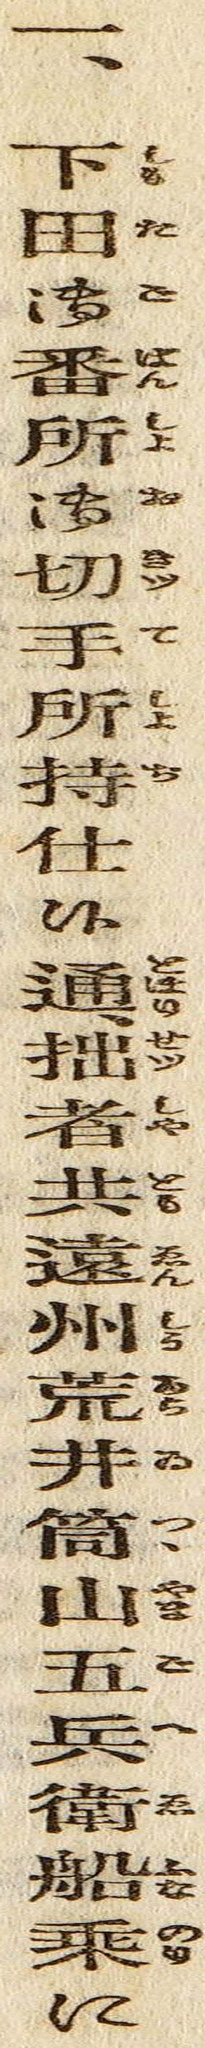一、下田御番所御切手所持仕候通、拙者共遠州荒井筒山五兵衛船乗に
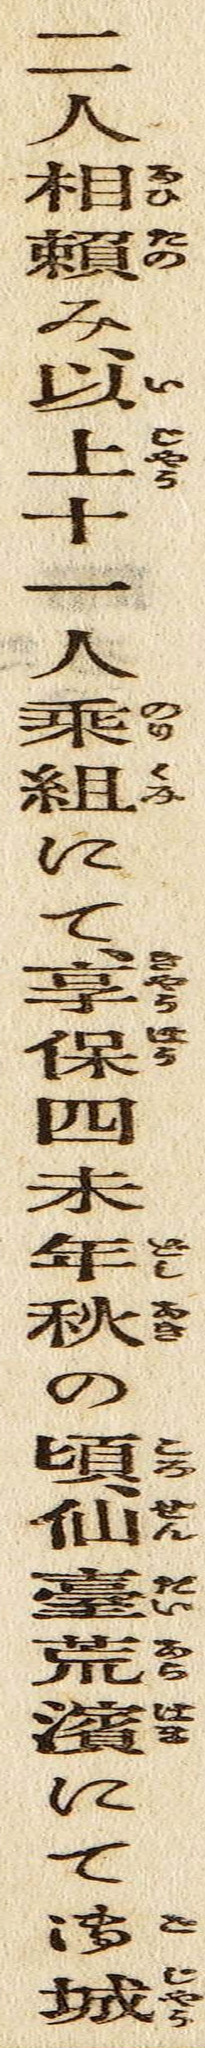二人相頼み、以上十一人乗組にて、享保四未年秋の頃、仙台荒浜にて御城
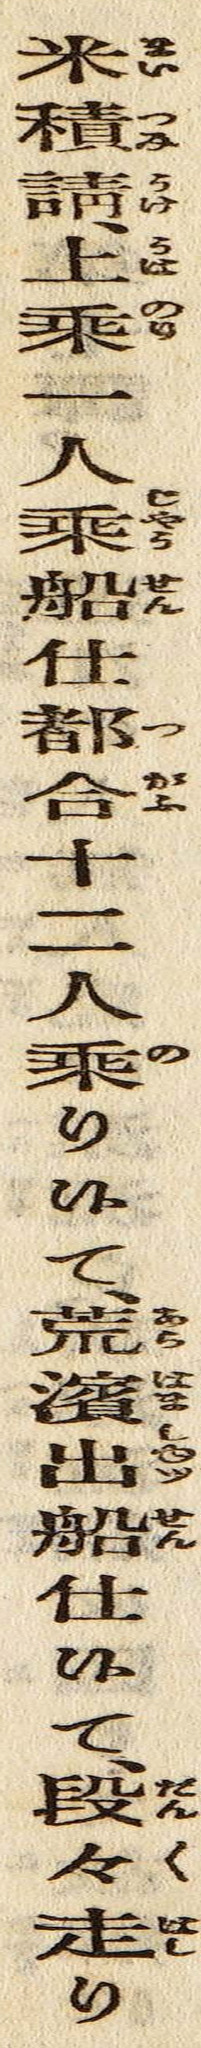米積請、上乗一人乗船仕都合十二人乗り候て、荒浜出船仕候て、段々走り
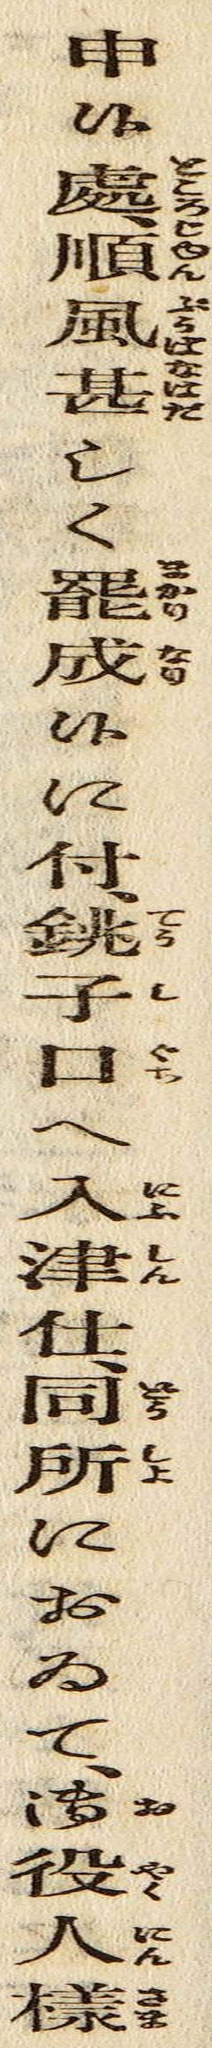申候処、順風甚しく罷成候に付、銚子口へ入津仕、同所におゐて、御役人様
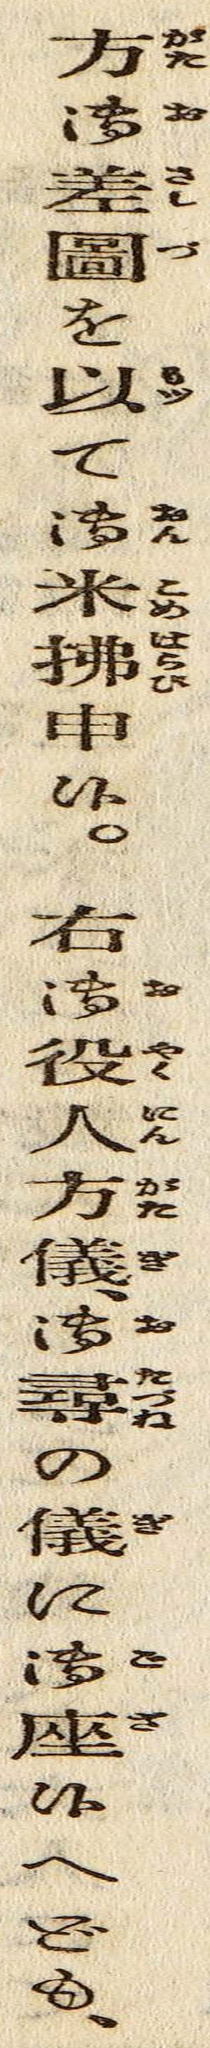方御差図を以て御米払申候。右御役人方儀、御尋の儀に御座候へども、
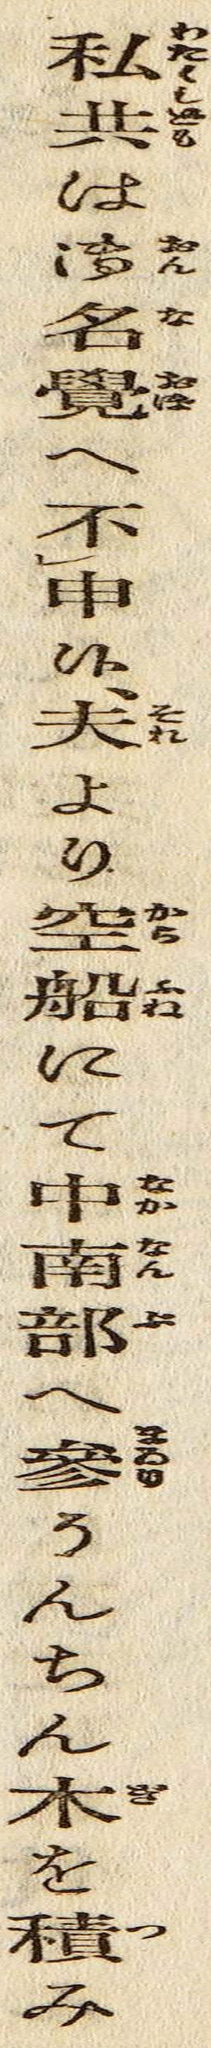私共は御名覚へ不申候、夫より空船にて中南部へ参うんちん木を積み
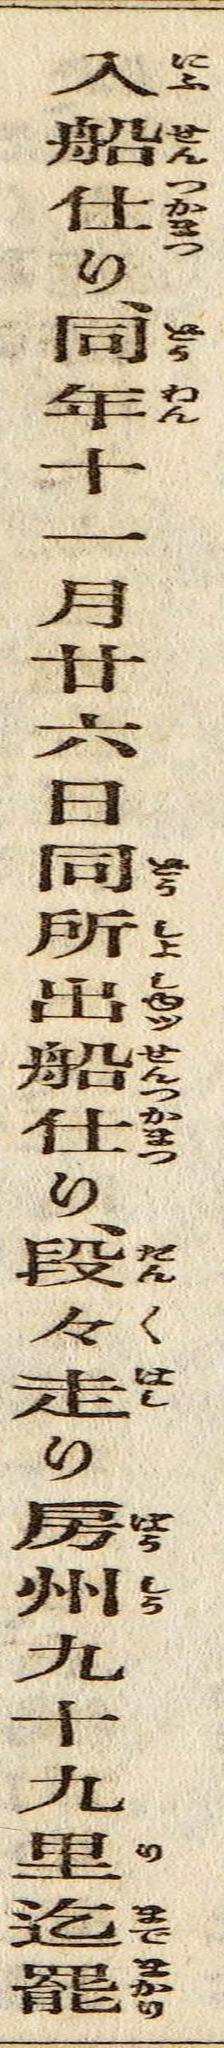入船仕り、同年十一月廿六日同所出船仕り、段々走り房州九十九里迄罷
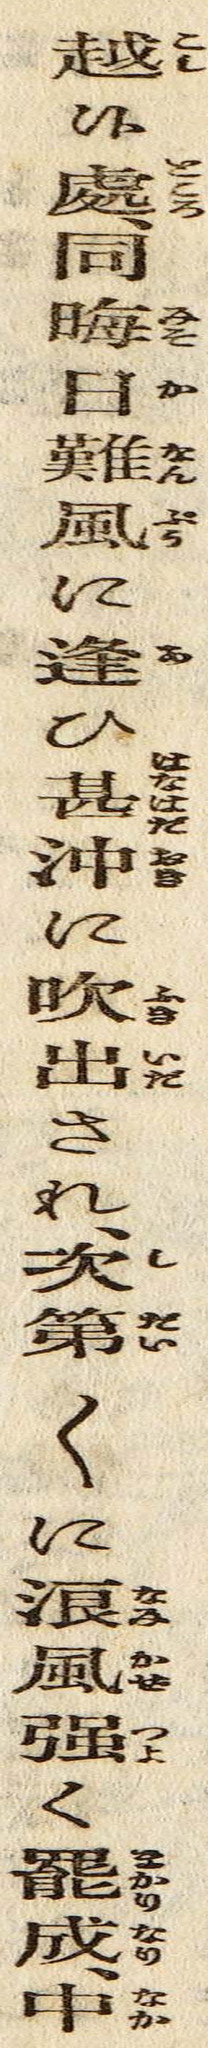越候処、同晦日難風に逢ひ甚沖に吹出され、次第〳〵に浪風強く罷成、中
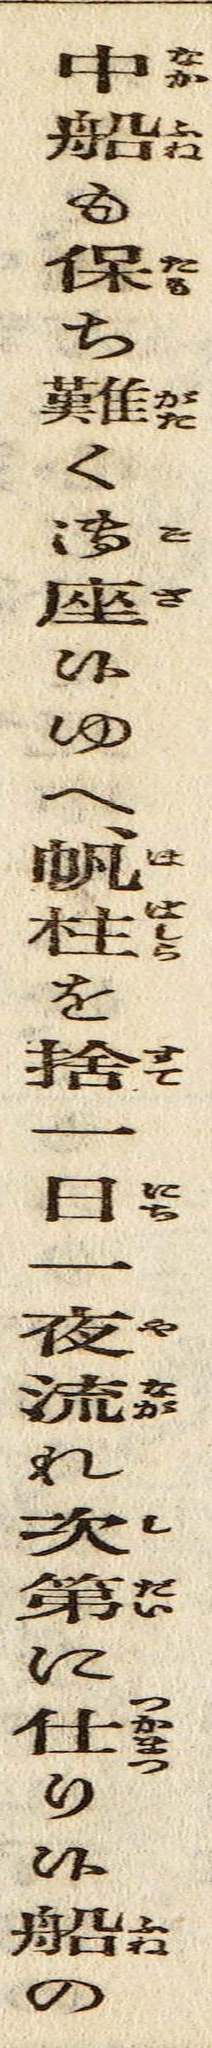中船も保ち難く御座候ゆへ、帆柱を捨一日一夜流れ次第に仕り候船の
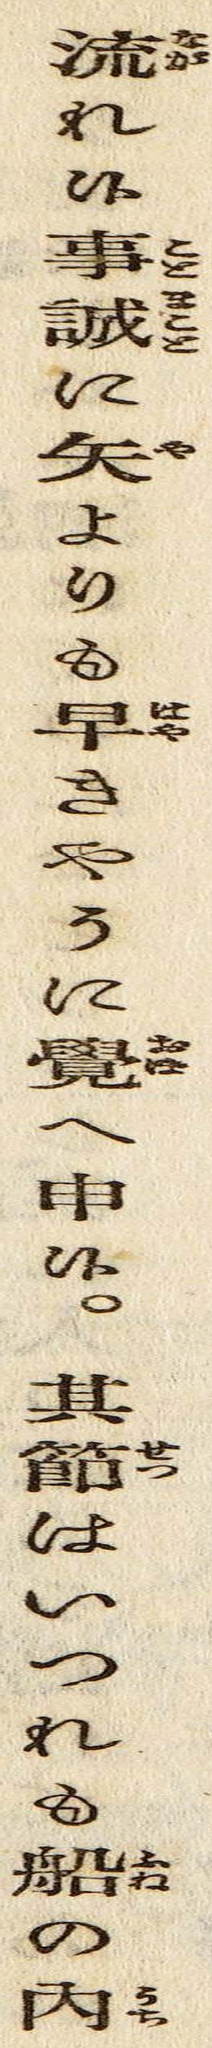流れ候事誠に矢よりも早きやうに覚へ申候。其節はいつれも船の内
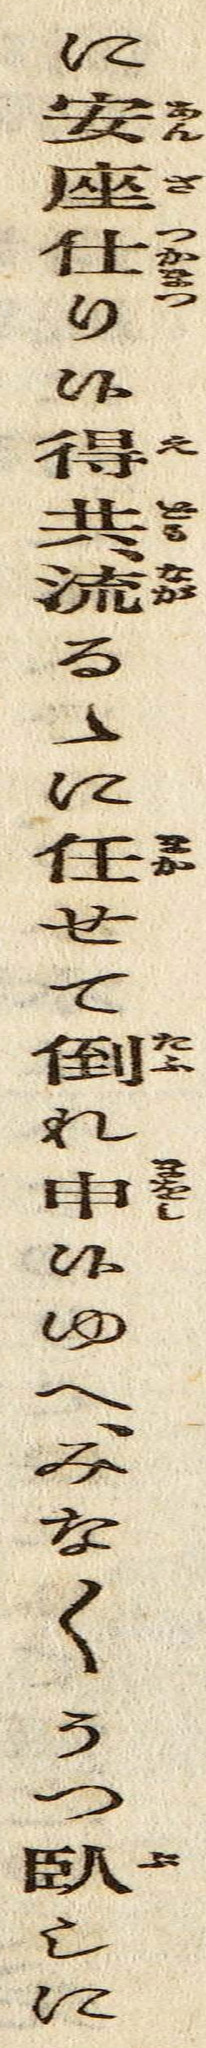に安座仕り候得共、流るゝに任せて倒れ申候ゆへ、みな〳〵うつ臥しに
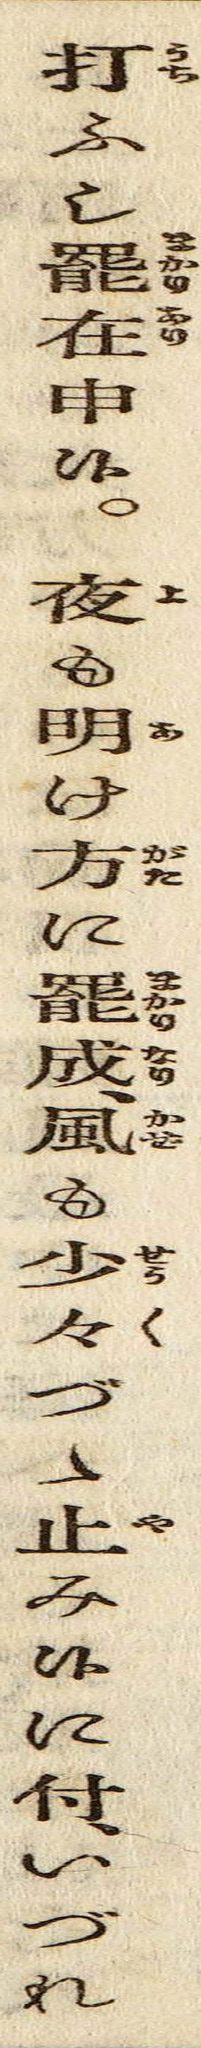打ふし罷在申候。夜も明け方に罷成、風も少々づゝ止み候に付、いづれ
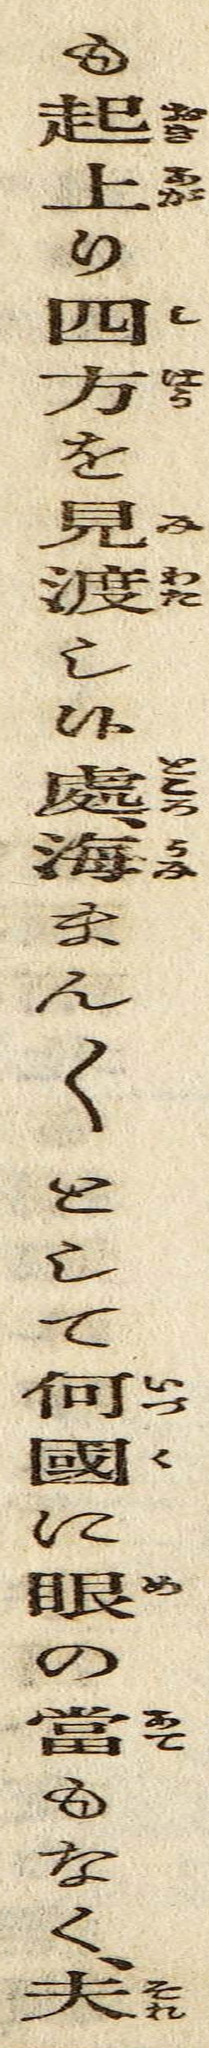も起上り四方を見渡し候処、海まん〳〵として何国に眼の当もなく、夫
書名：日本漂流譚
